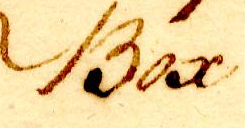Box
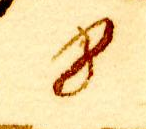8
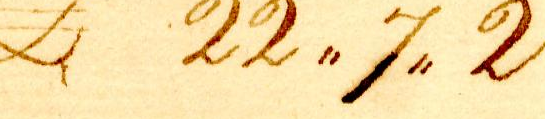£ 22.7.2
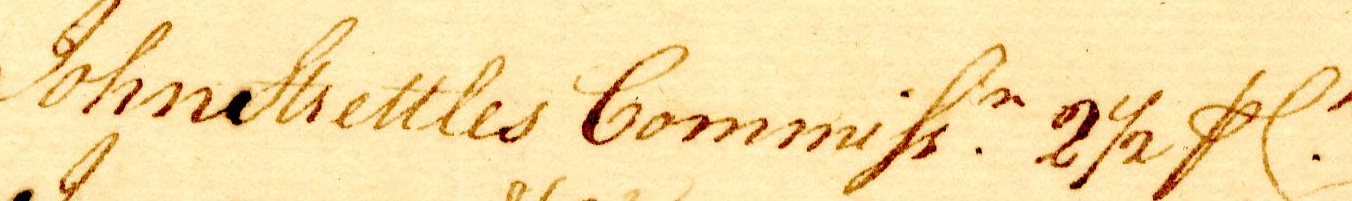John Strettles Commiss^r. 2 1/2 per C^h
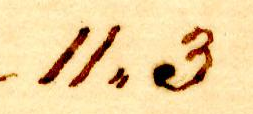11. 3
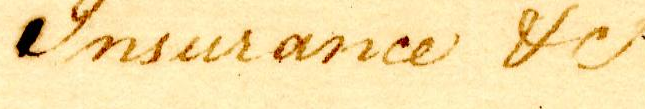Insurance &c
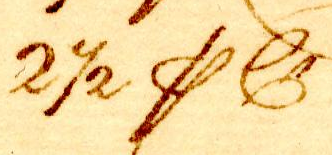2 1/2 per Ca
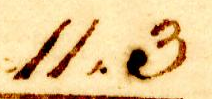11. 3
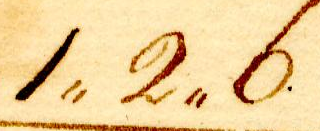1. 2. 6.
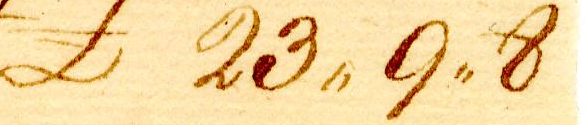£ 23. 9. 8
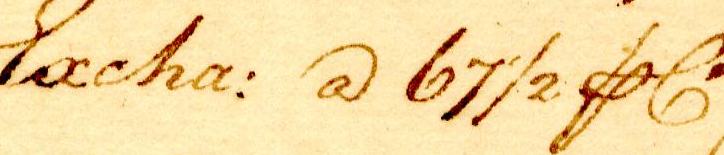Excha: @ 67s2 per 6
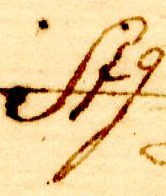St^g
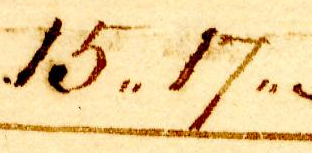15. 17.
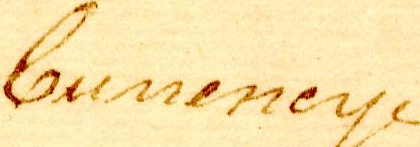Currency.
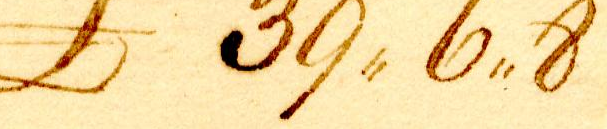£ 39. 6. 8
